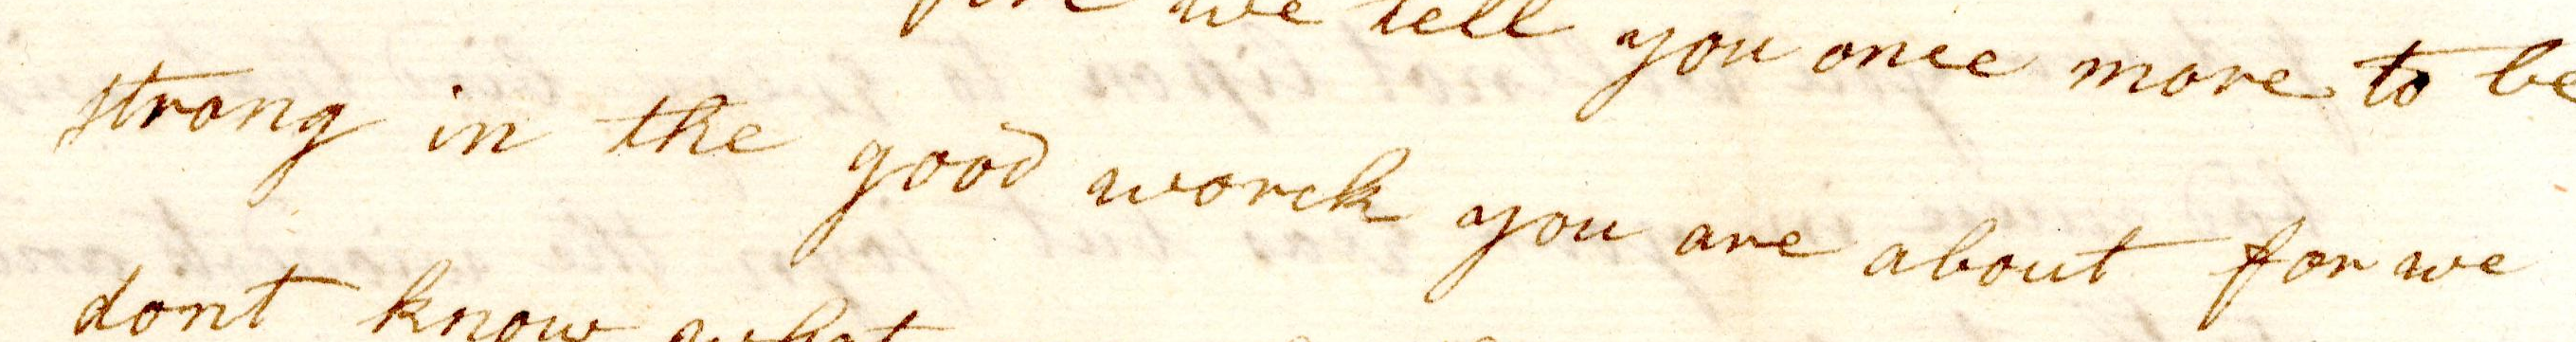strong in the good worck you are about for we
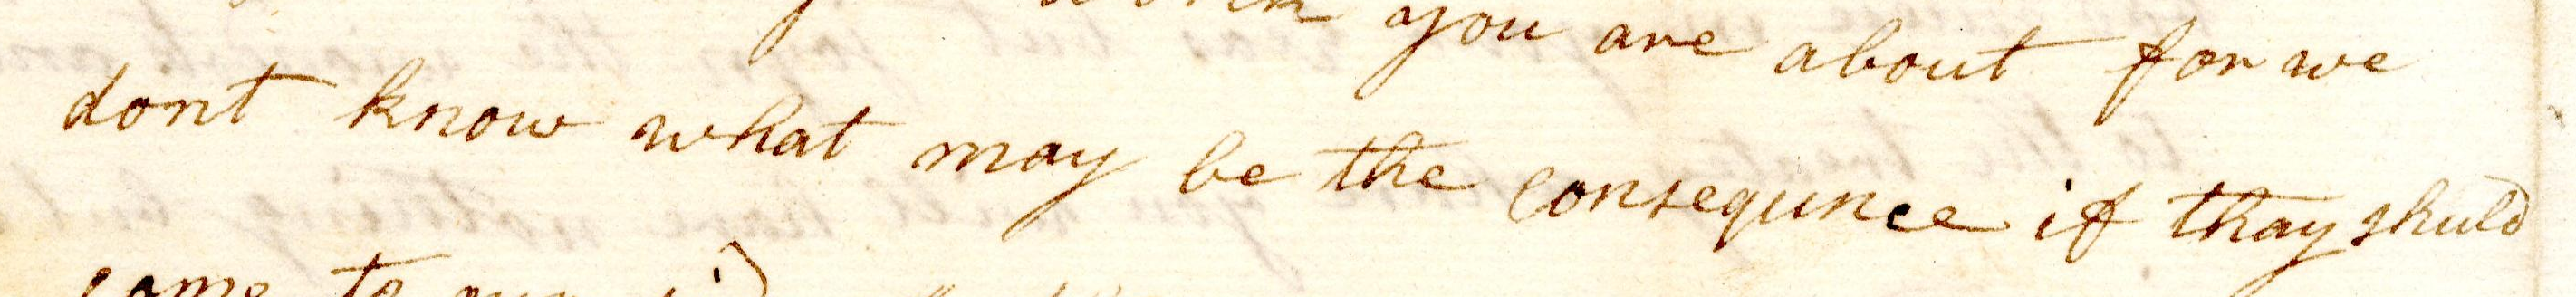dont know what may be the consequnce if thay shuld
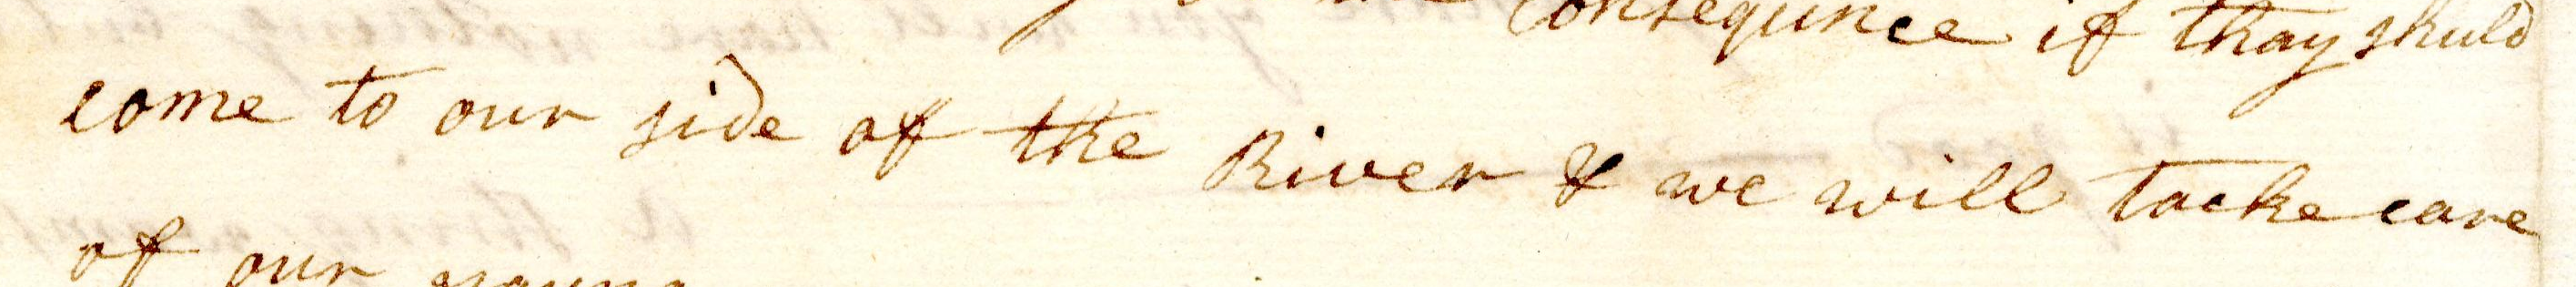come to our side of the River & we will tacke care
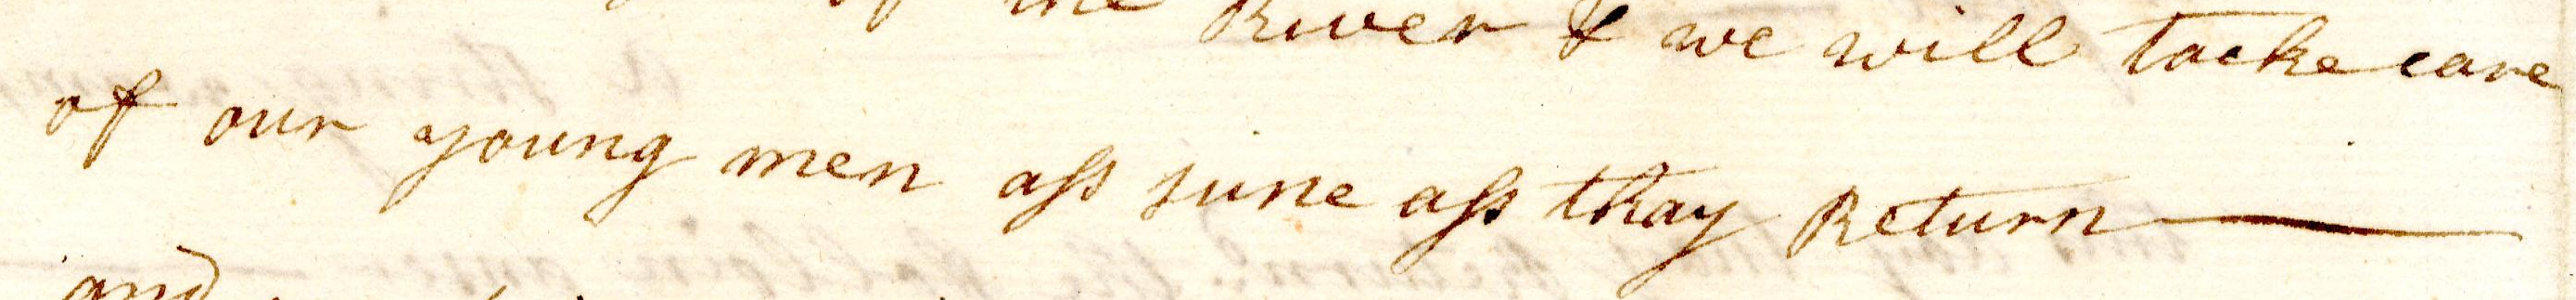of our young men ass sune ass thay Return-
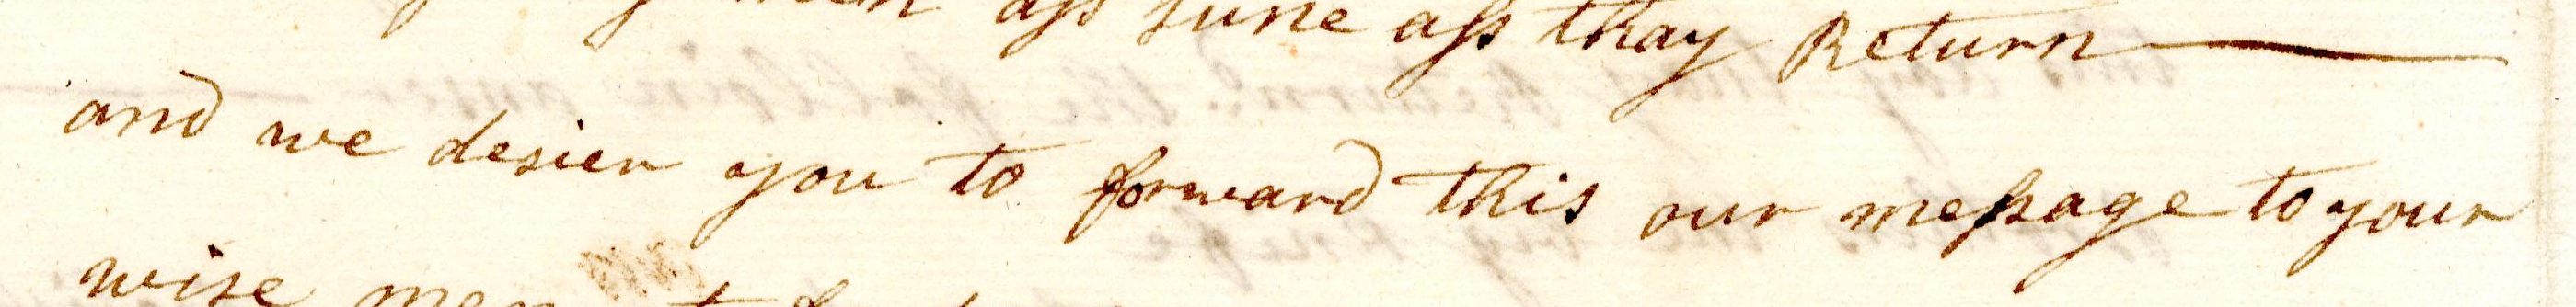and we desier you to forward this our message to your
